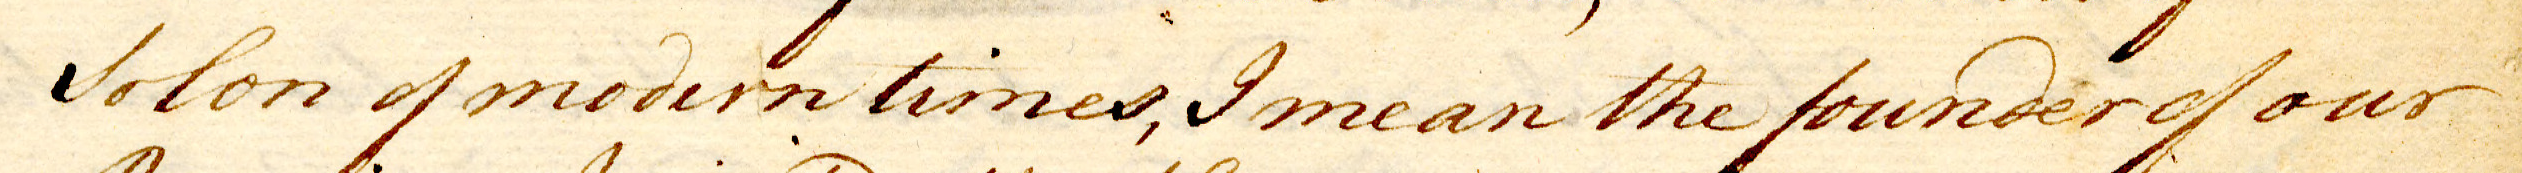Solon of modern times, I mean the founder of our
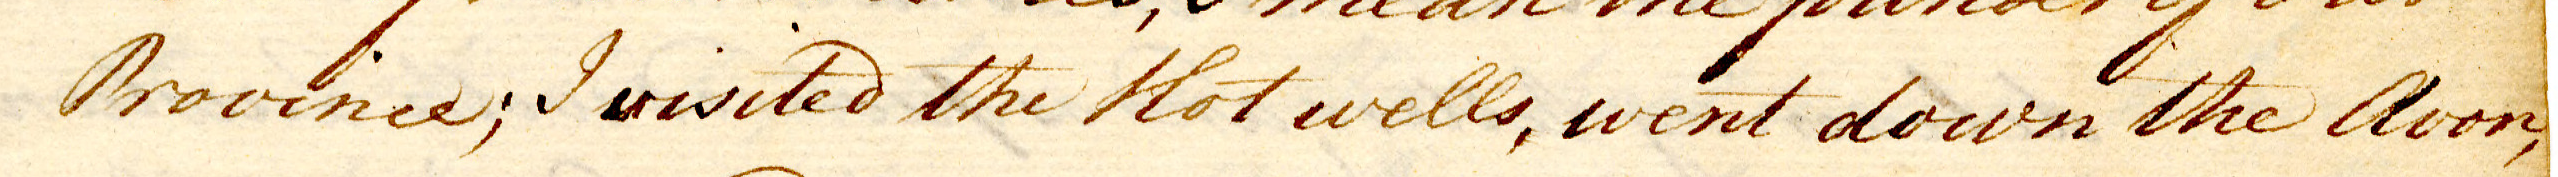Province; I visited the Hot wells, went down the Avon,
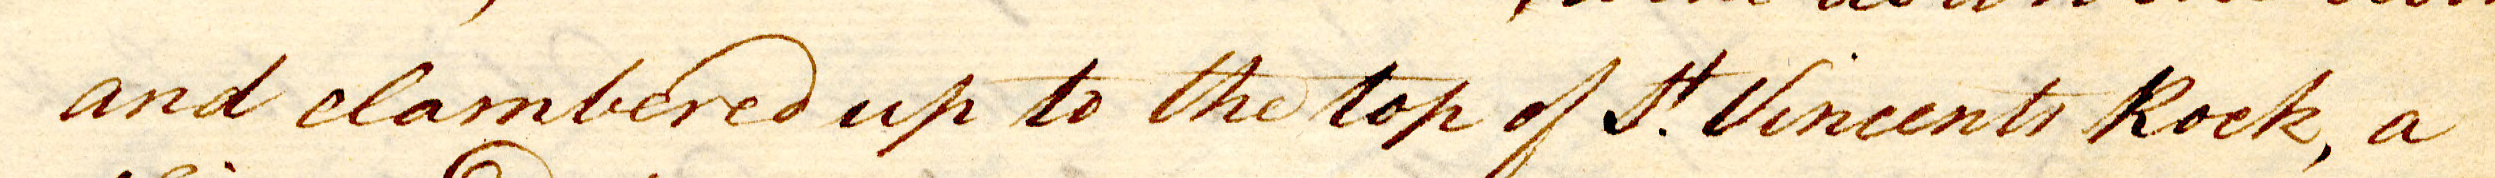and clambered up to the top of S^t. Vincents Rock, a
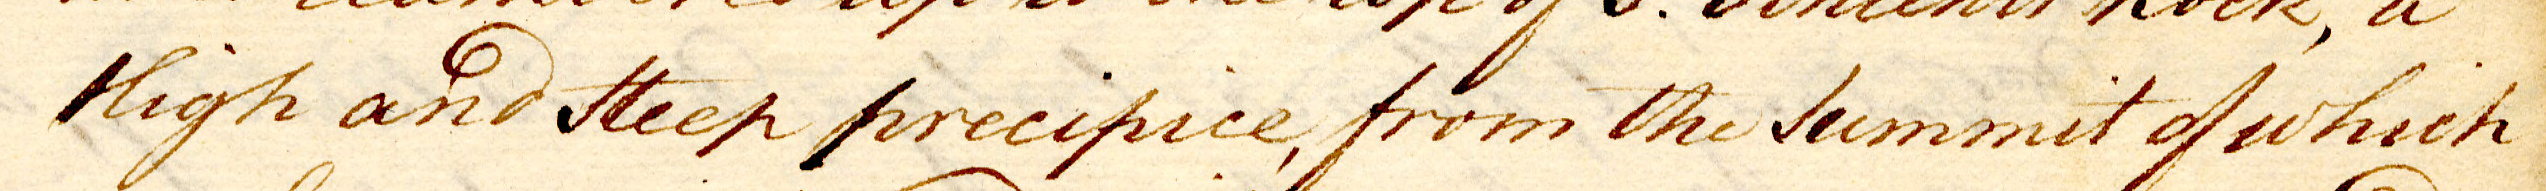High and steep precipice, from the summit of which
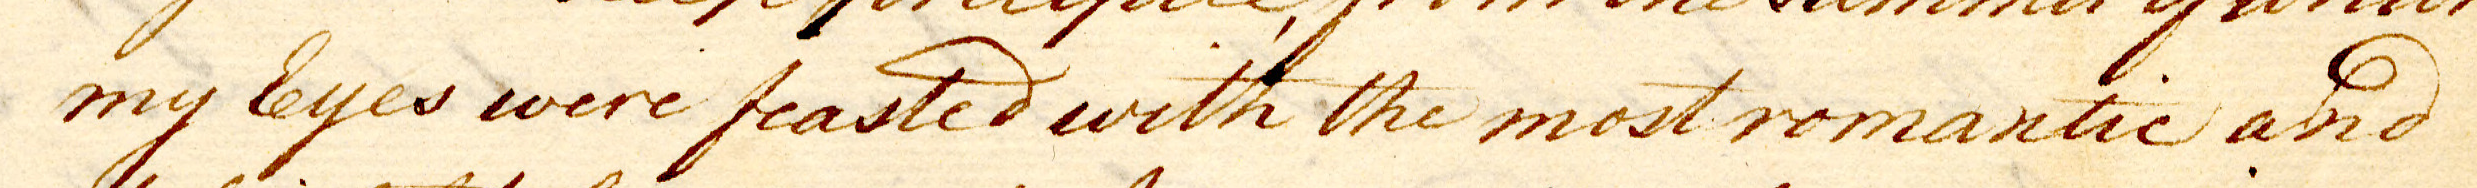my Eyes were feasted with the most romantic and
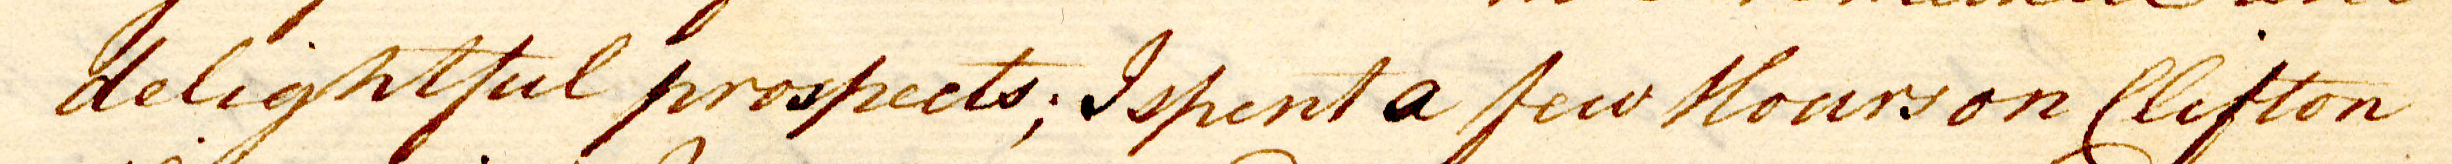delightful prospects; I spent a few Hours on Clifton
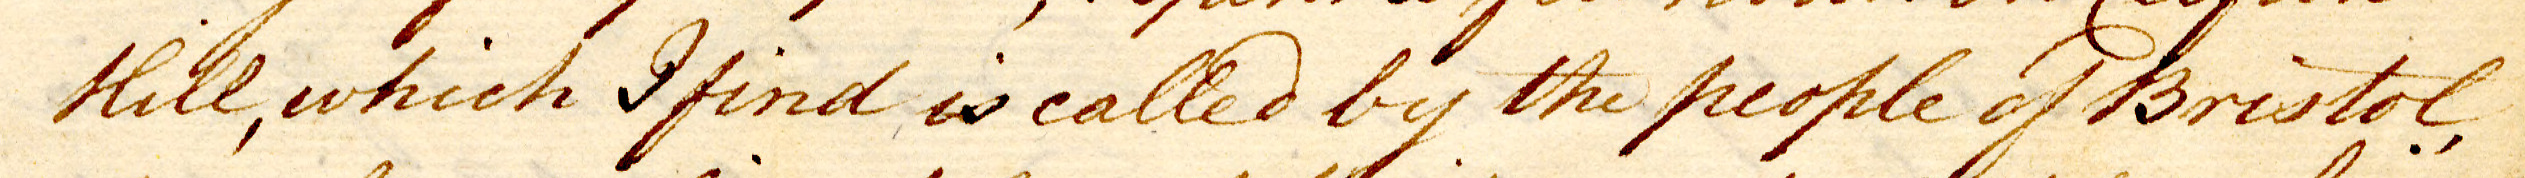Hill, which I find is called by the people of Bristol,
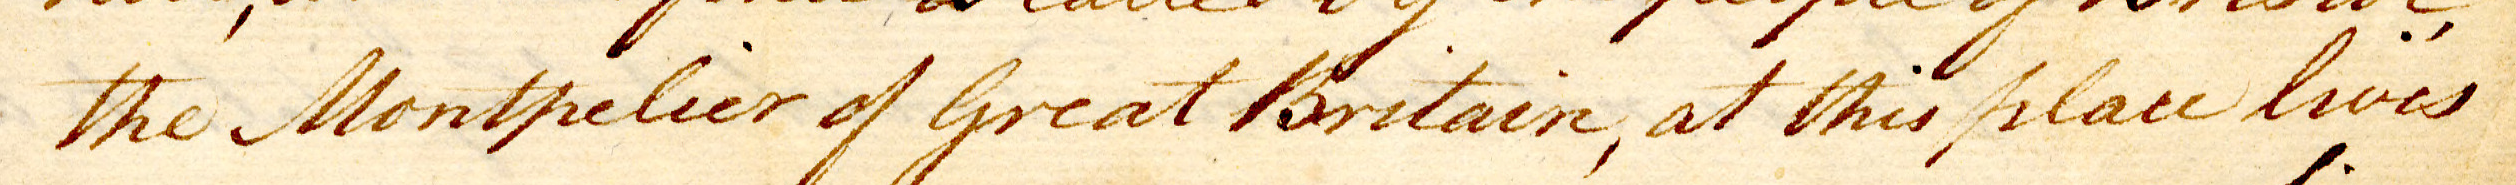the Montpelier of Great Britain, at this place lives
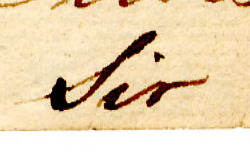Sir
